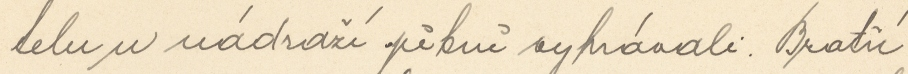telu u nádraží pěkně vyhrávali. Bratří
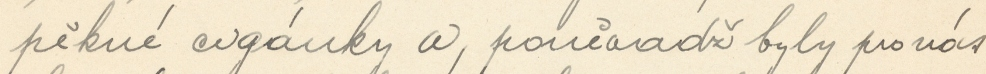pěkné cigánky a, poněvadž byly pro nás
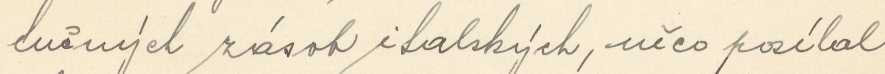tučných zásob italských, něco posílal
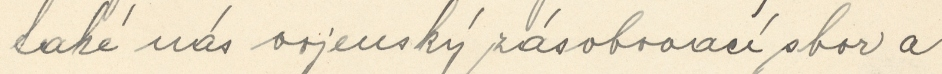také nás vojenský zásobovací sbor a
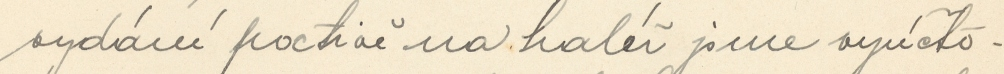vydání poctivě na haléř jsme vyúčto-
